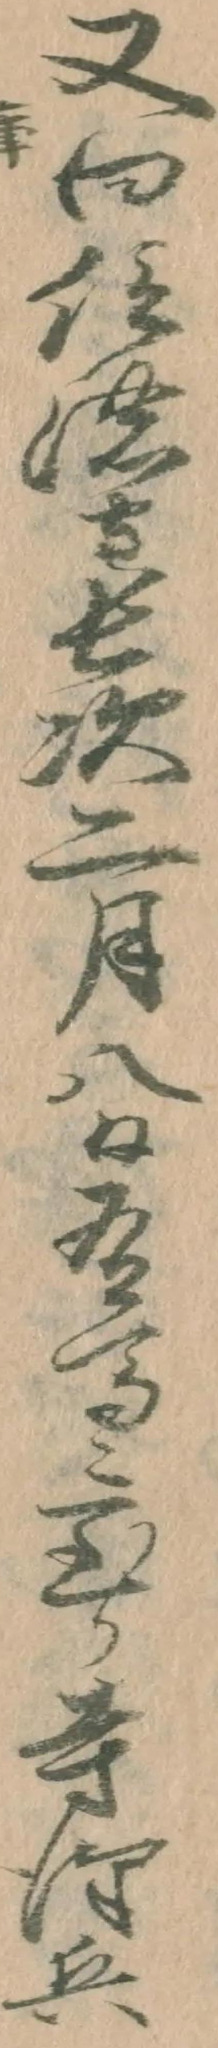又曰信濃守長次二月八日有馬に至り寺沢兵
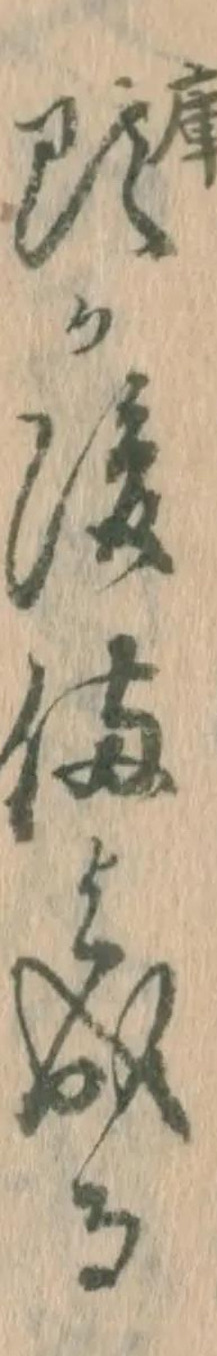庫頭か後備与成る
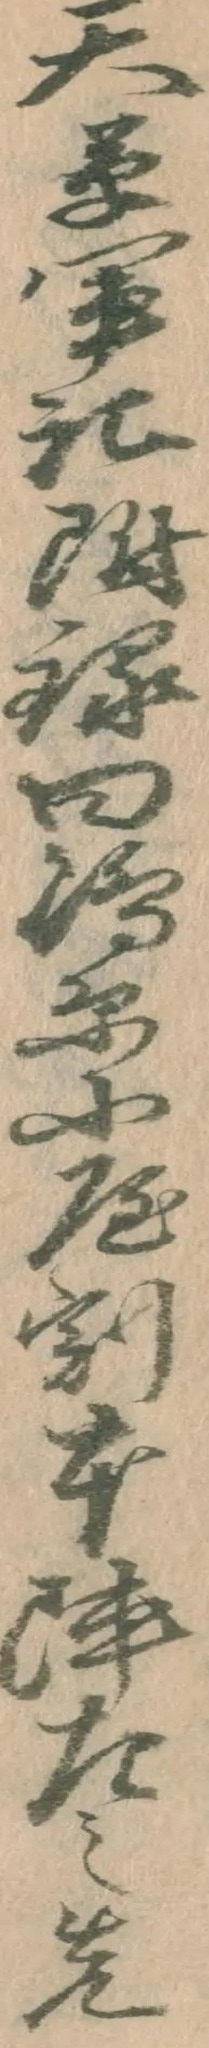天草軍記附録曰島原小屋割本陣左之先
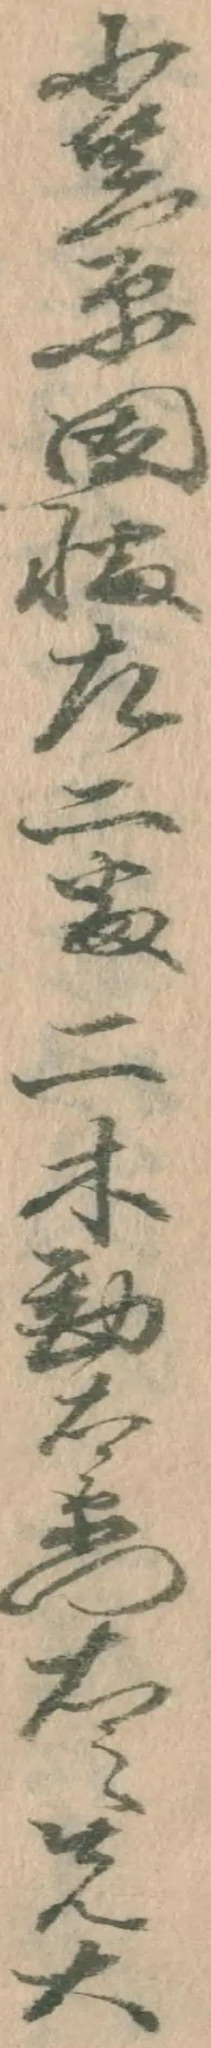小笠原因幡左二番二木勘右衛門右之先大
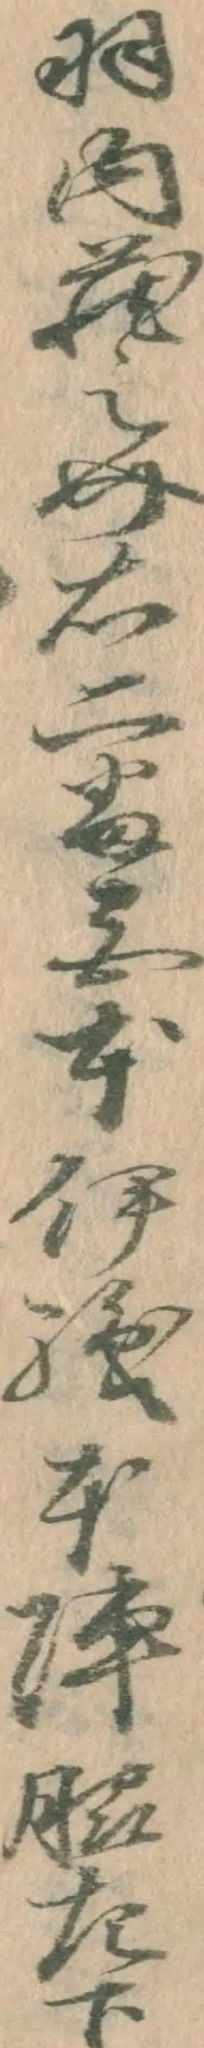羽角蔵之介右二番宮本伊織本陣脇左下
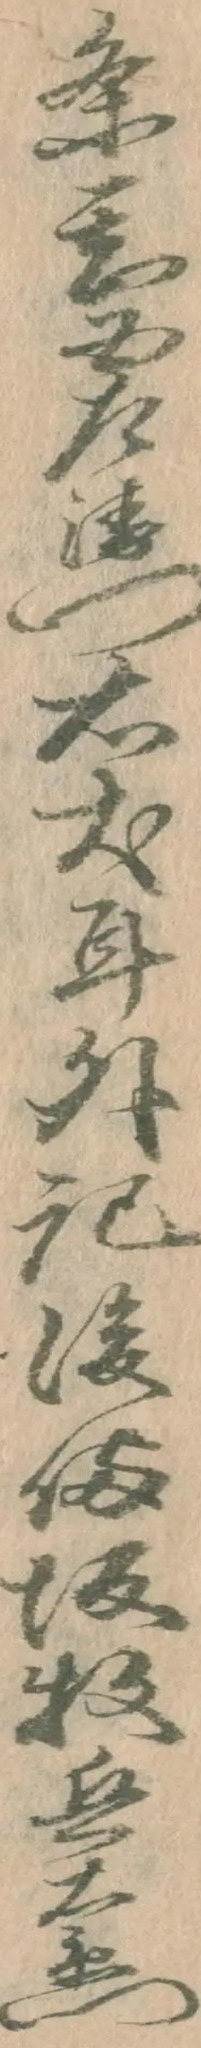条甚五左衛門右丈耳外肥後備坂牧兵右衛門
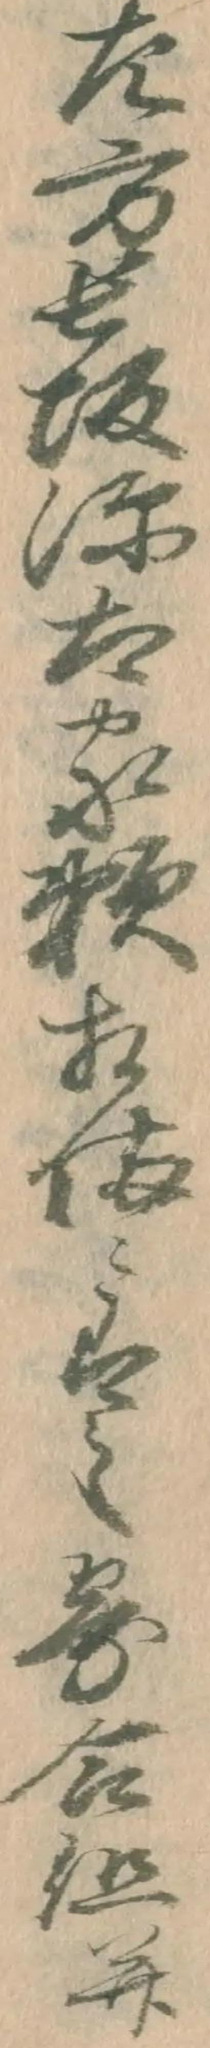左方長坂源太家頼相備に尽之寄合組幷

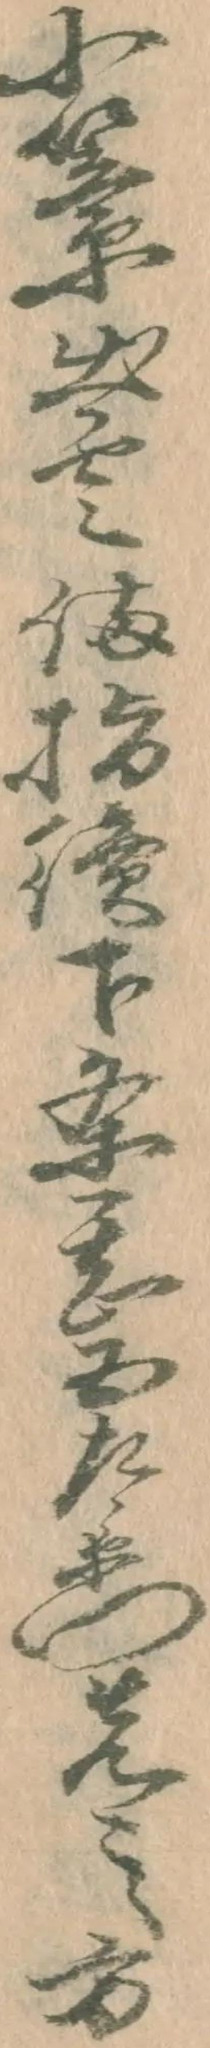小笠原出雲備指続下条甚五左衛門先之方
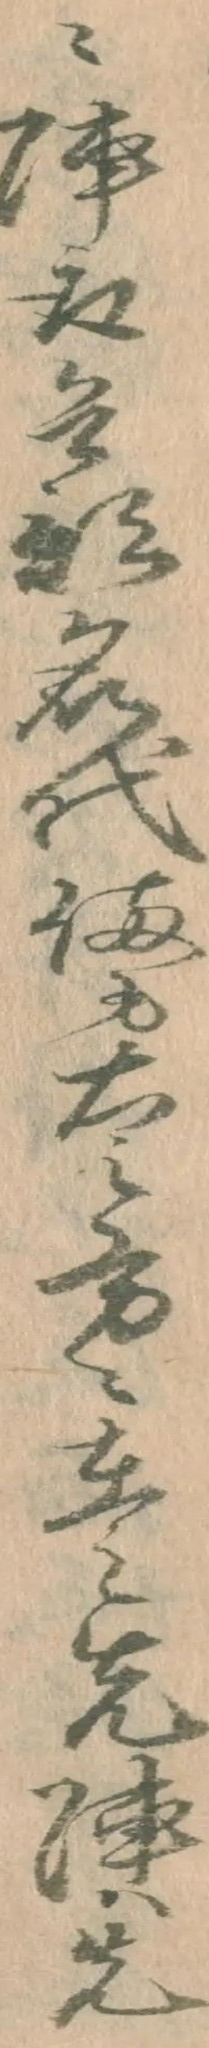に陣取兵部名代備も右之方に在之先陣は先
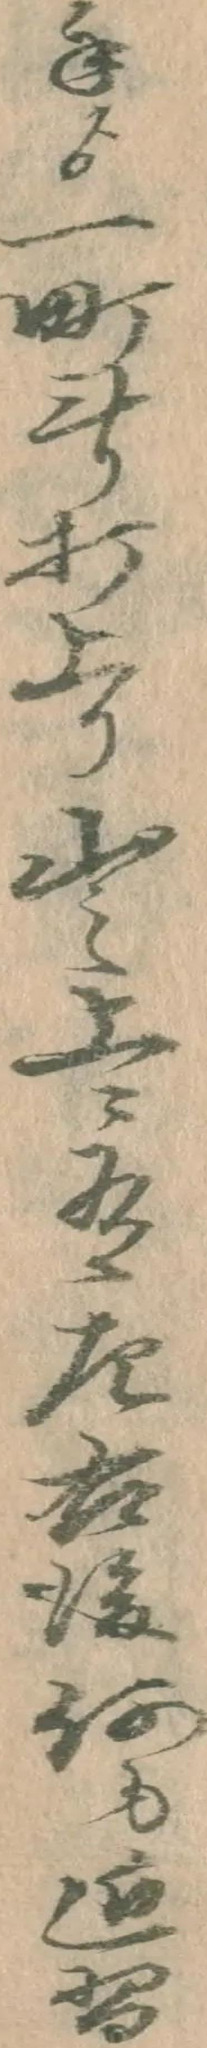手ゟ一町斗り打上り山之上に有左右後何も近習
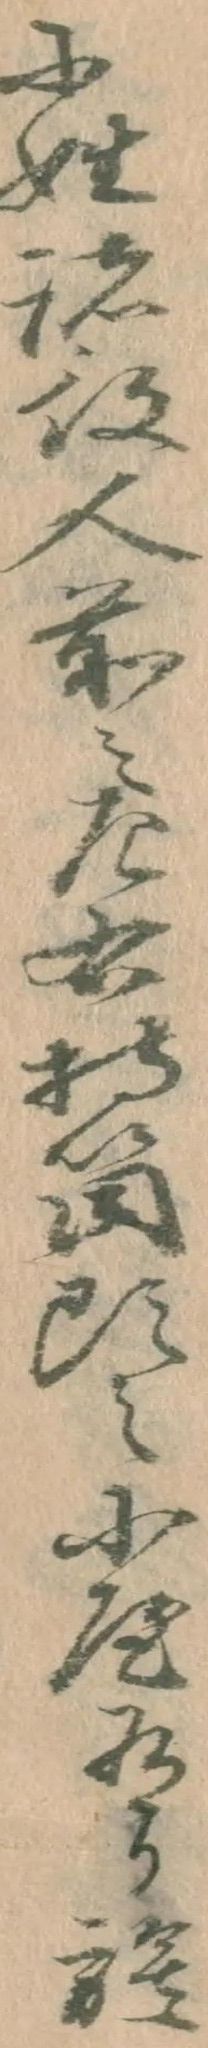小姓諸役人前之左右持筒頭之小屋有り旗
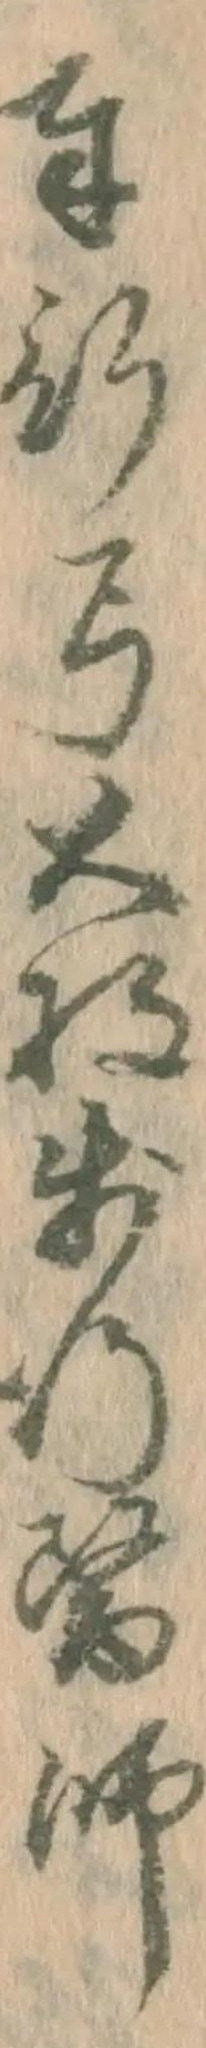奉行弓大将歩行醫師
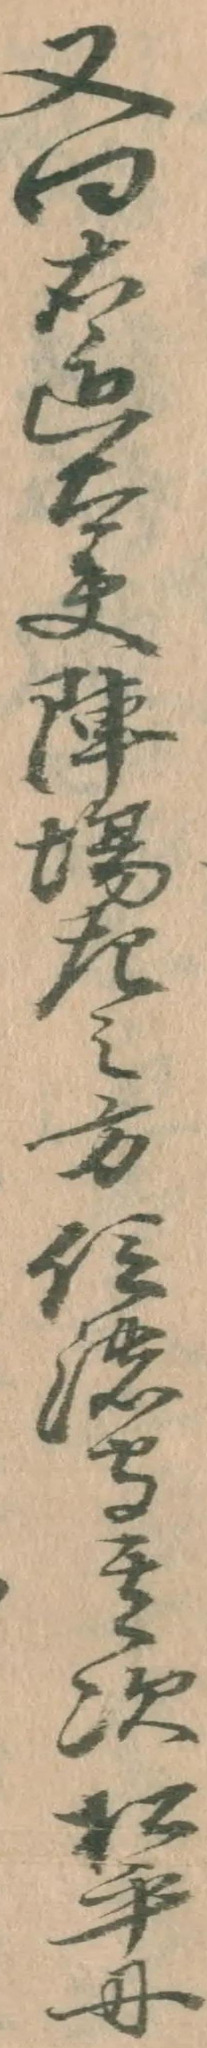又曰右近太夫陣場左之方信濃守其次松平丹
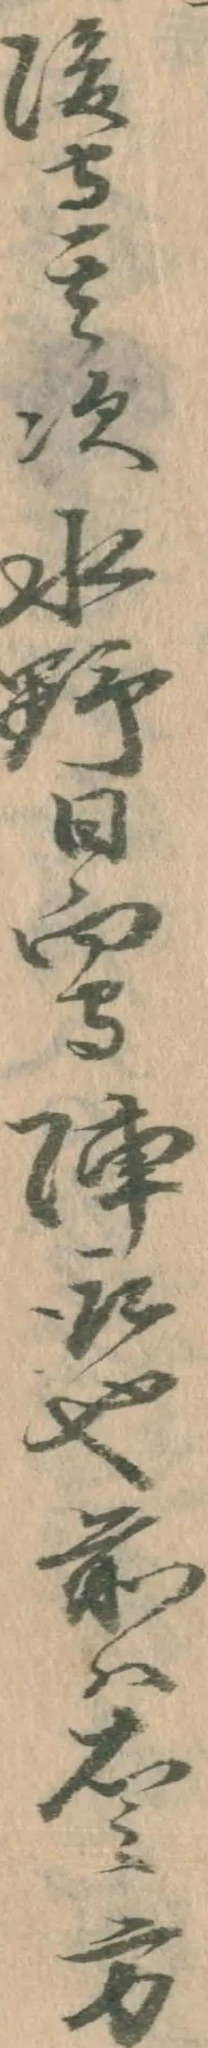後守其次水野日向守陣取也前は右之方
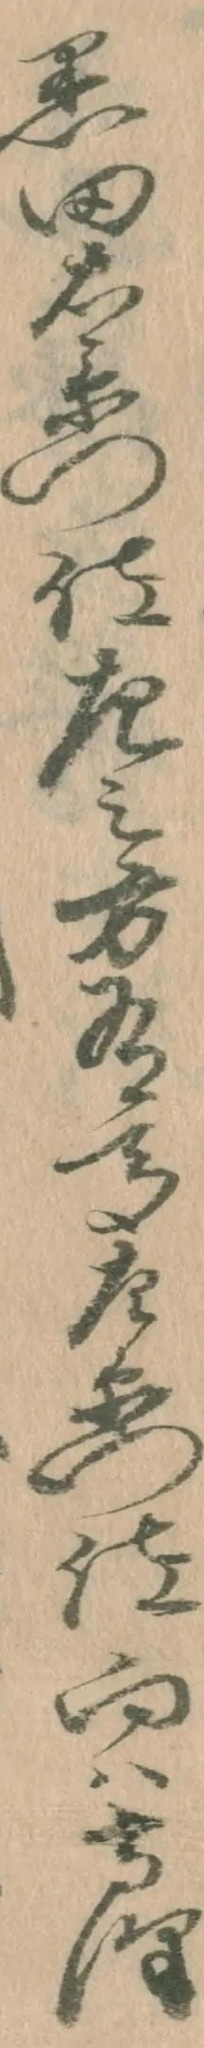黒田右衛門佐左之方有馬左衛門佐向は寺沢
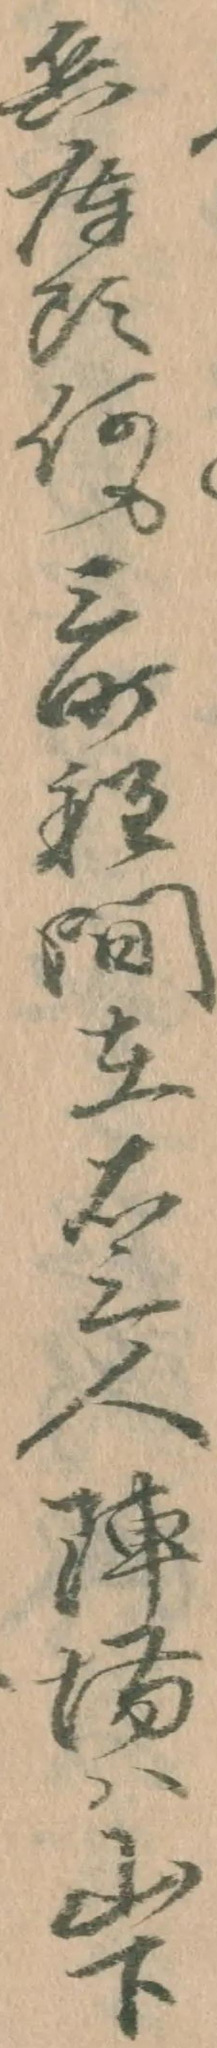兵庫頭何も三町程間在右三人陣場は山下
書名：切支丹御退治記 49巻. [6]
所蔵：国立国会図書館 National Diet Library, JAPAN
